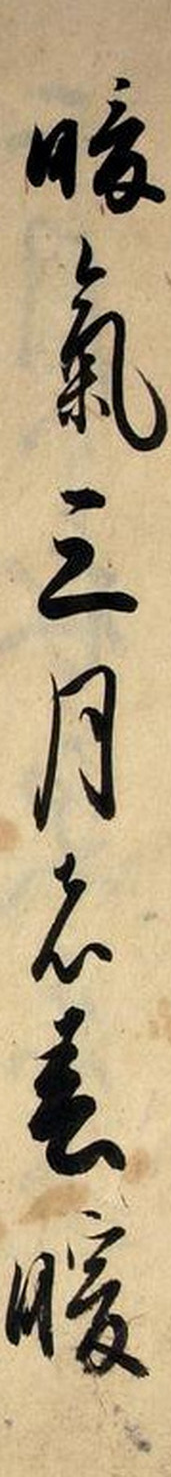暖気三月は春暖
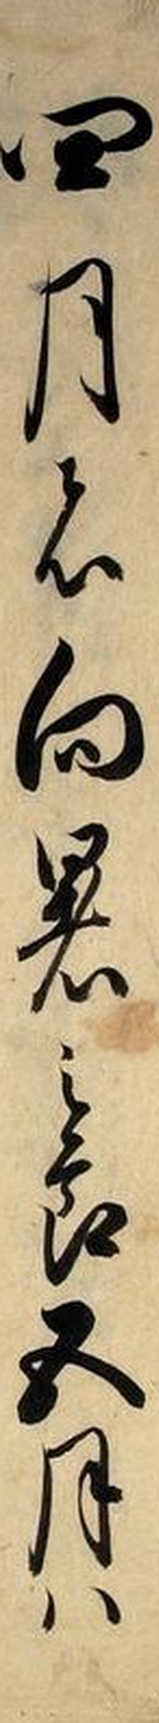四月は向暑之節五月ハ
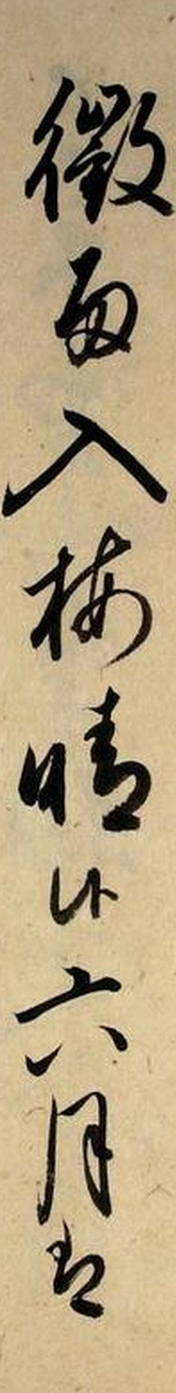黴雨入梅晴候六月は
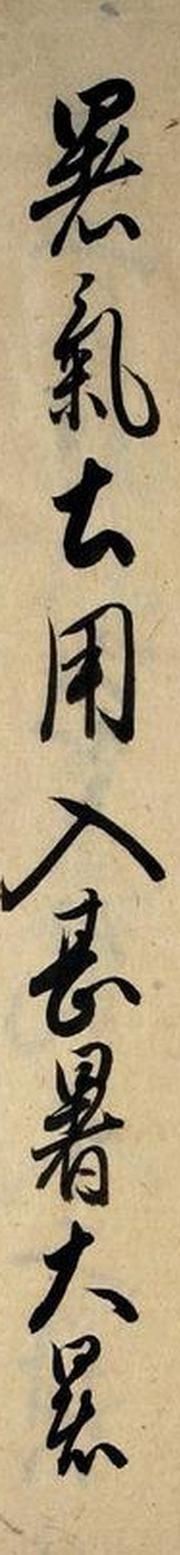暑気土用入甚暑大暑
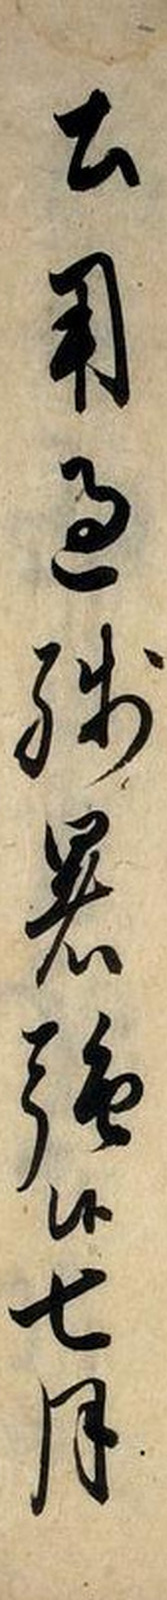土用過残暑強候七月
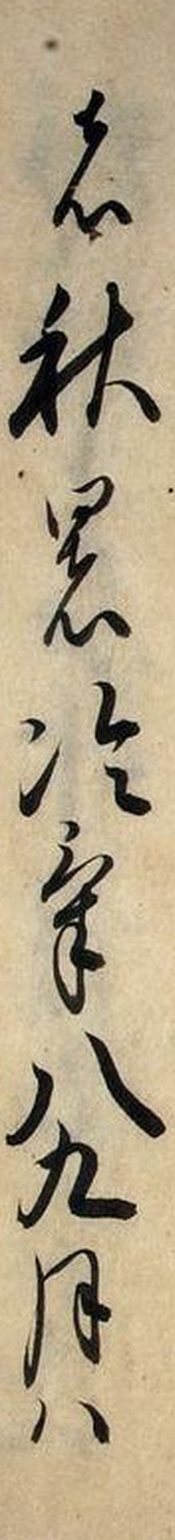は秋暑冷気八九月ハ

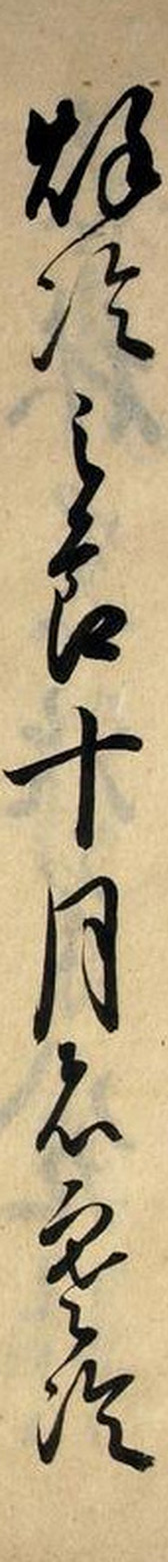秋冷之節十月は寒冷
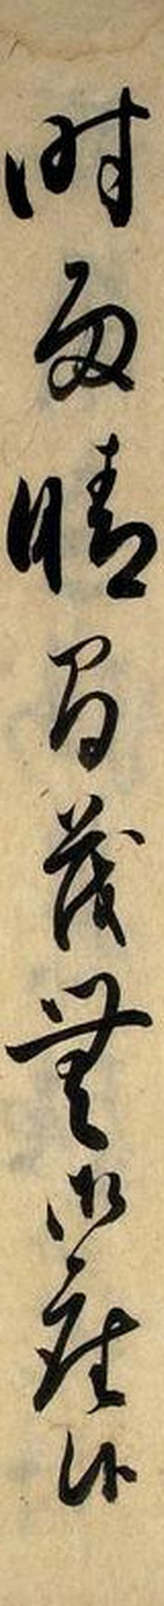時雨晴間茂無御座候
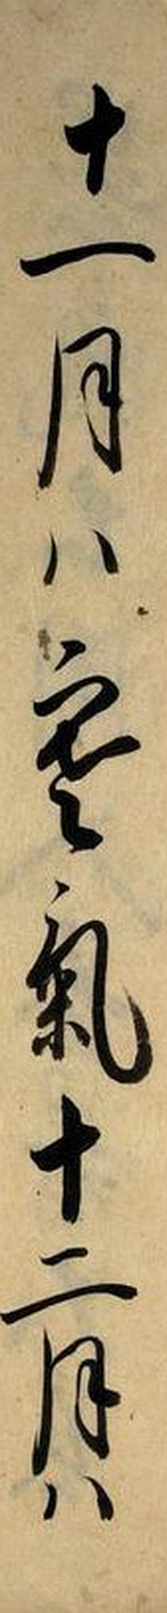十一月ハ寒気十二月ハ
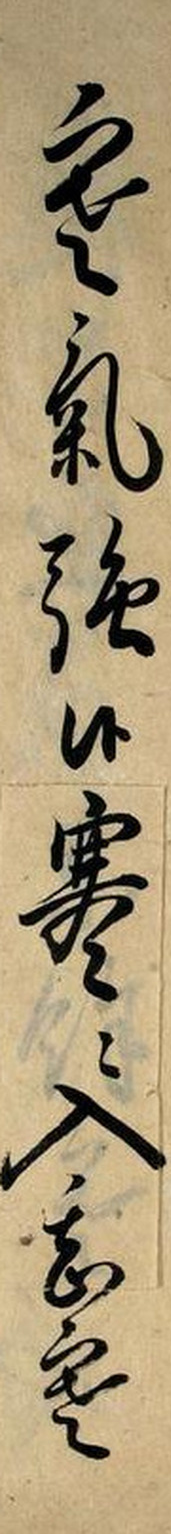寒気強候寒ニ入甚寒
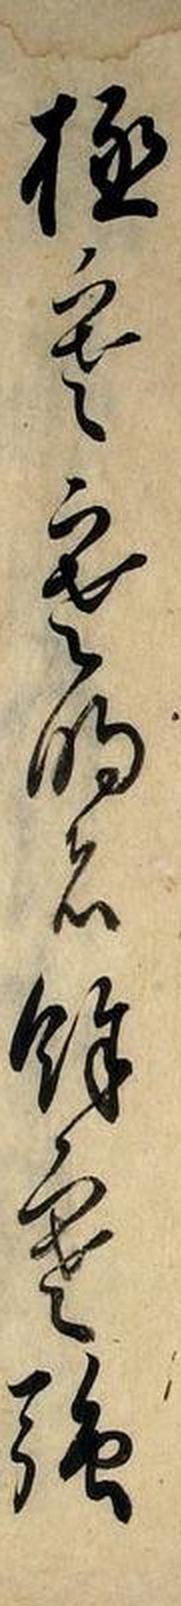極寒寒明は余寒強
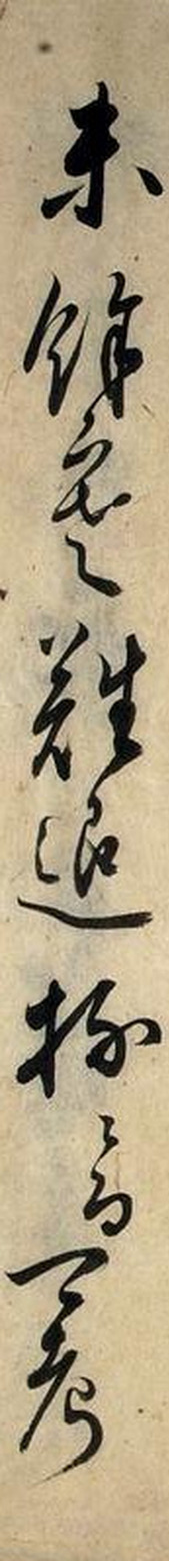未余寒難退様ニ而可考

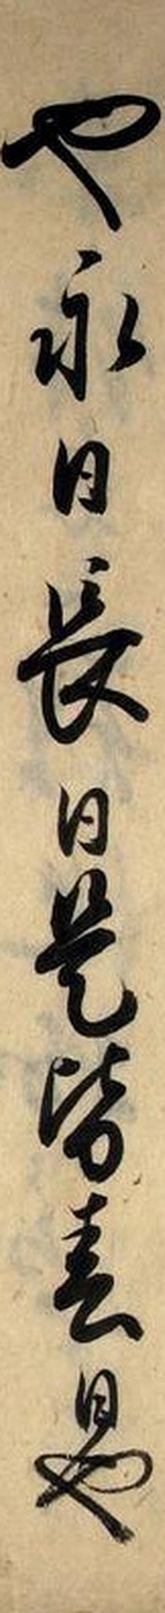也永日長日是皆春日也
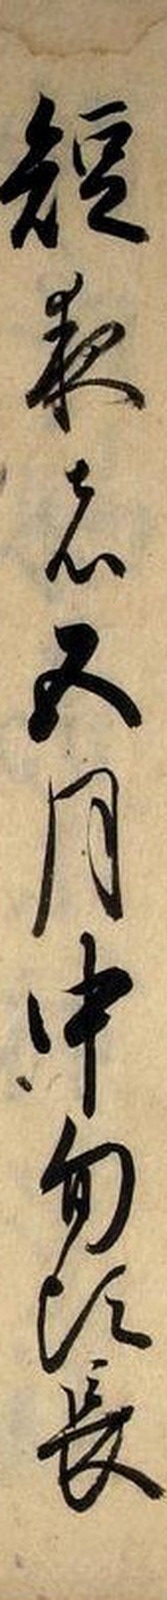短夜は五月中旬頃長
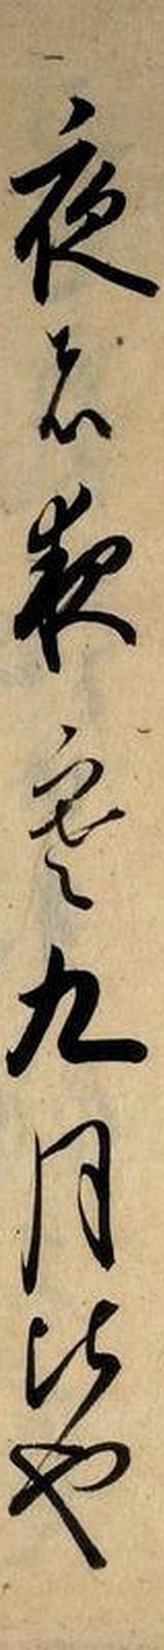夜は夜寒九月頃也
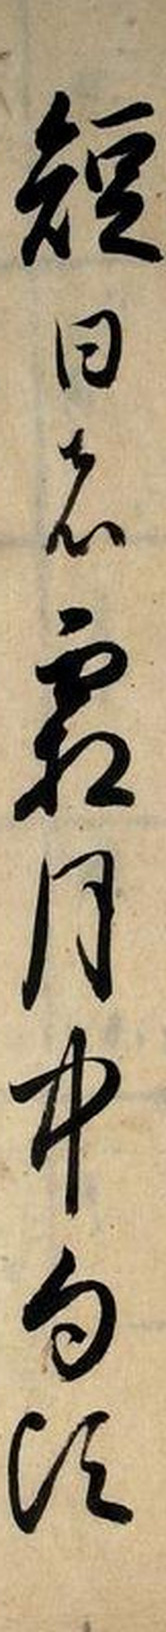短日は霜月中旬頃
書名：消息千字文（往来物、手習手本）
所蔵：福井県文書館 Fukui Prefectural Archives
